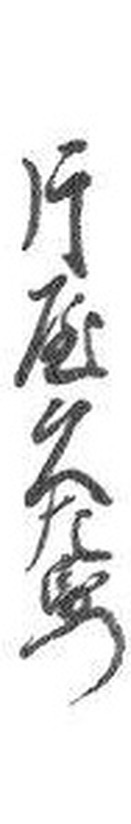片屋久左衛門
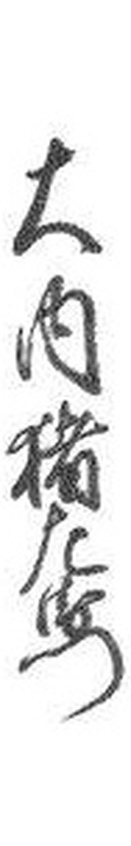大内猪左衛門
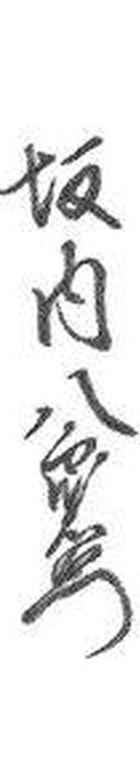坂内八郎右衛門
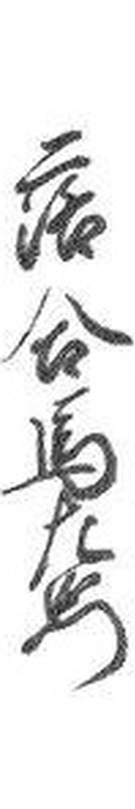落合馬左衛門
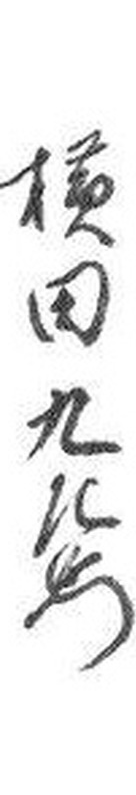横田九左衛門
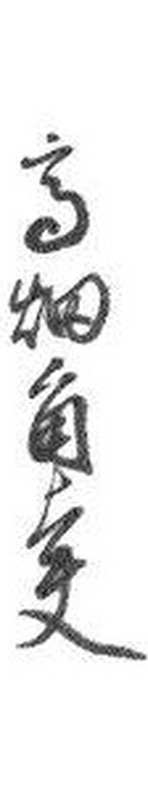高畑角太夫
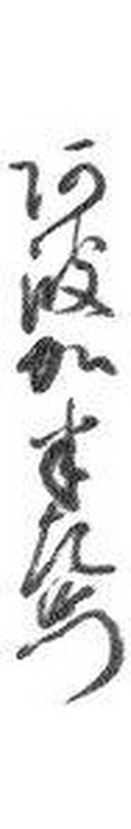阿波加半左衛門
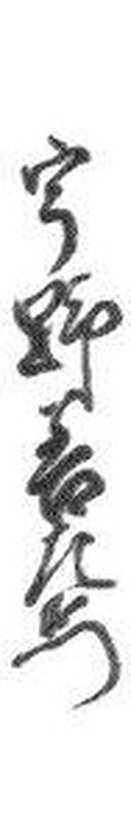宇野善左衛門
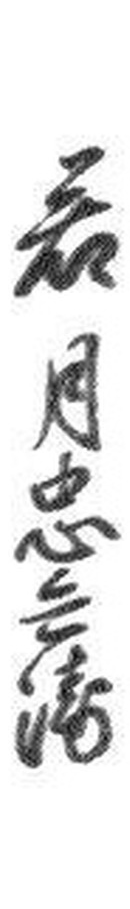若月忠兵衛
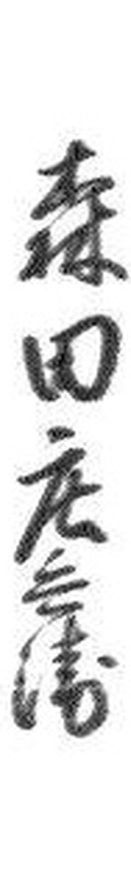森田庄兵衛
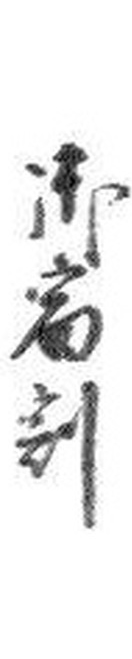御宿割
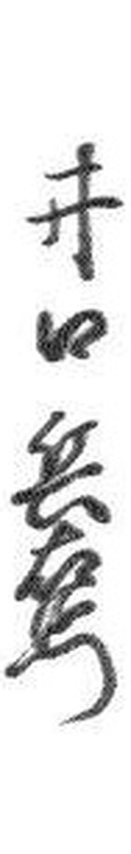井口兵右衛門
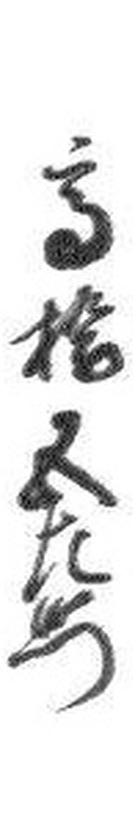高橋五左衛門

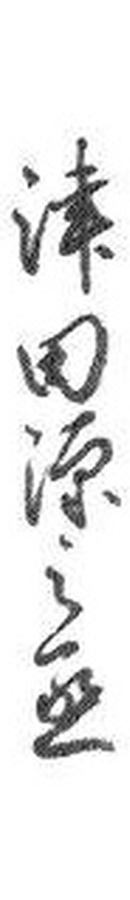津田源之丞
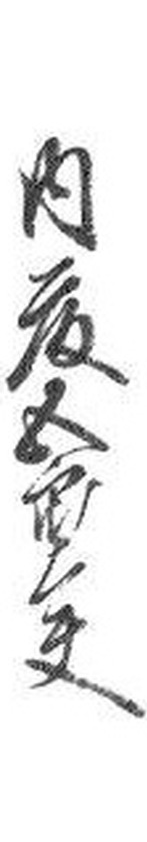内藤五郎太夫
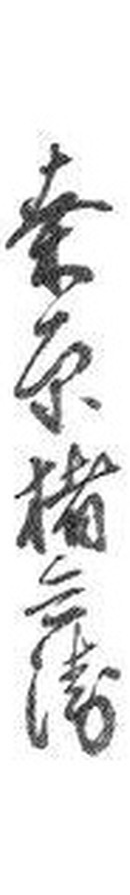桑原猪兵衛
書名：家譜 四 忠昌公 従寛永七年到正保四年
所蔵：福井県文書館 Fukui Prefectural Archives
